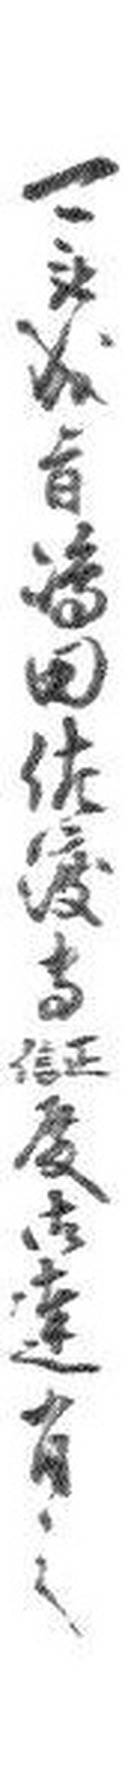可被成旨嶋田佐渡守正信殿御達有之
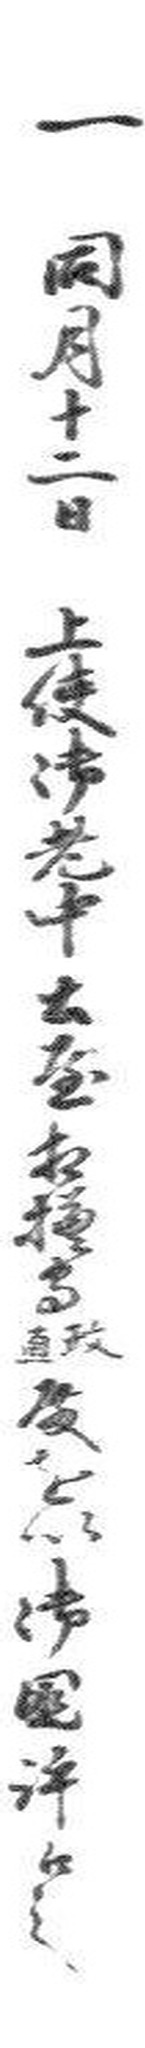一同月十二日上使御老中土屋相模守政直殿を以御国許江之

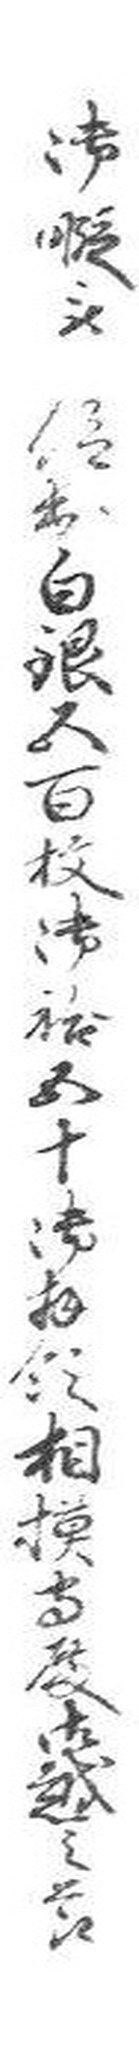御暇被仰出白銀五百枚御袷五十御拝領相模守殿御越之節
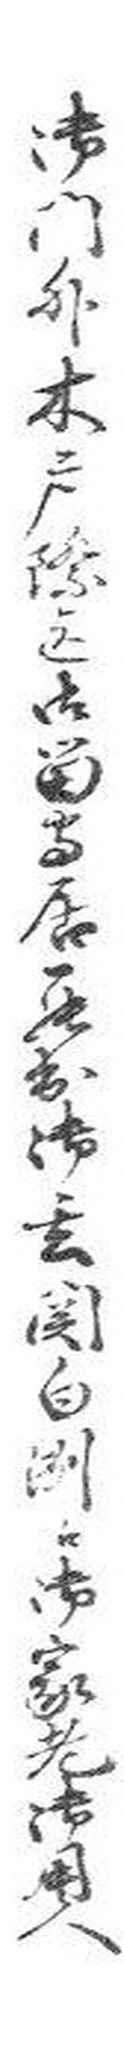御門外木戸際迄御留守居罷出御玄関白洲江御家老御用人
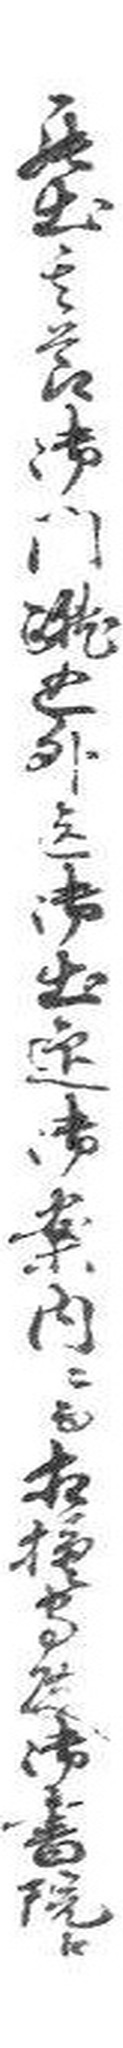罷出其節御門蹴込外迄御出迎御案内ニ而相模守殿御書院江
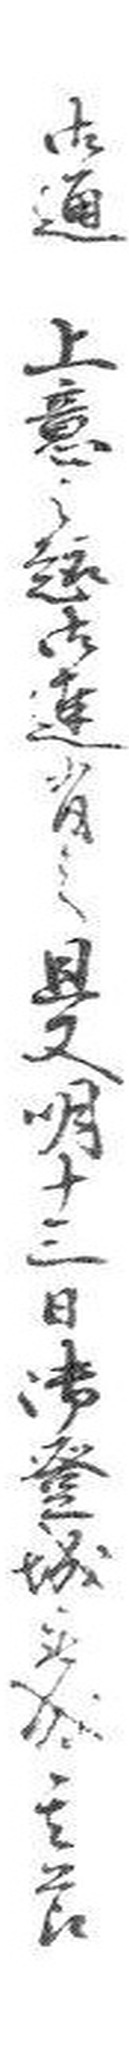御通上意之趣御達有之且又明十三日御登城被成其節
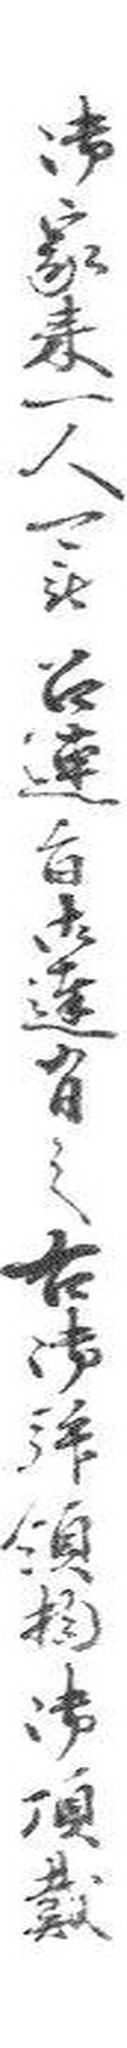御家来一人可被召連旨御達有之右御拝領物御頂戴
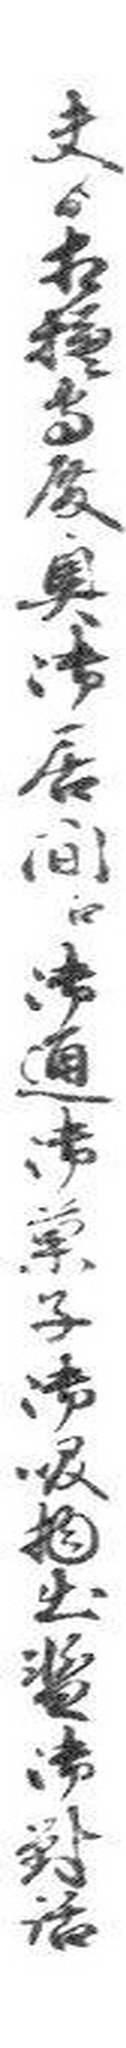夫ゟ相模守殿奥御居間江御通御菓子御吸物出暫御対話
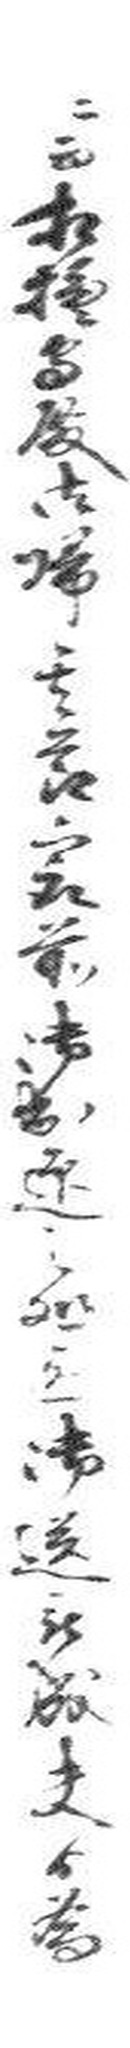ニ而相模守殿御帰其節最前御出迎之処迄御送被成夫ゟ為
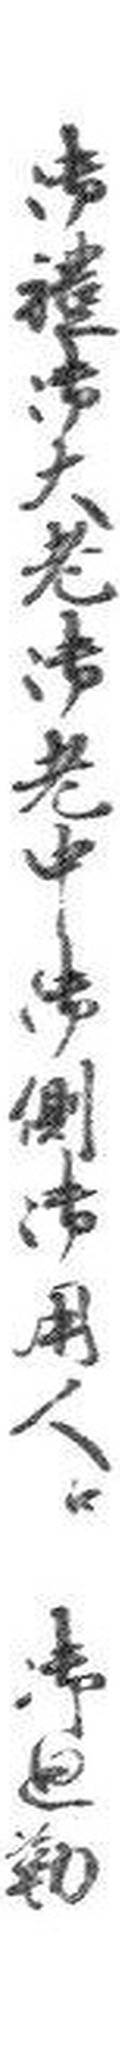御礼御大老御老中御側御用人江御廻勤
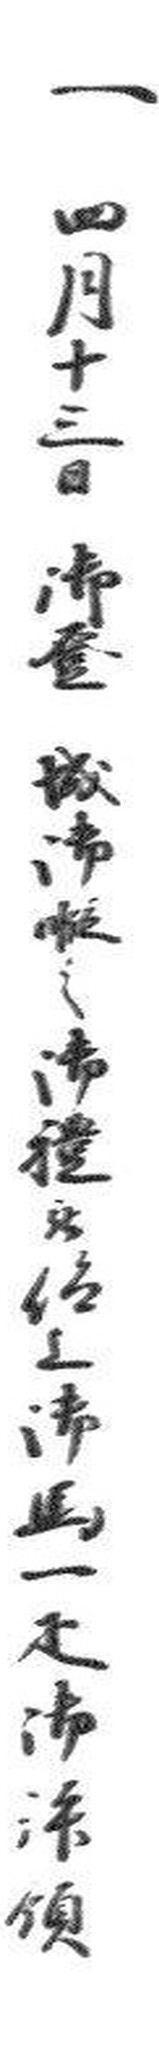一四月十三日御登城御暇之御礼被仰上御馬一疋御拝領
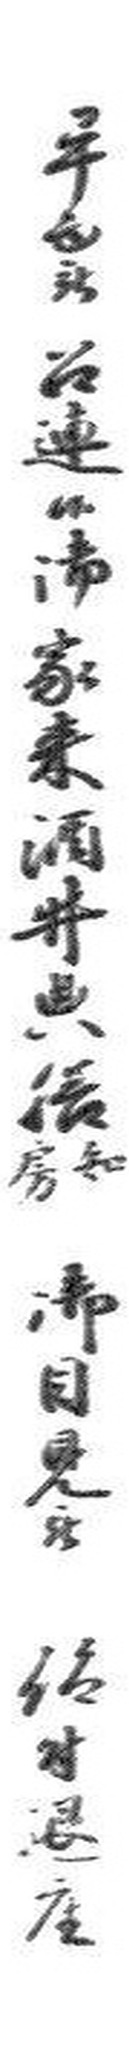畢而被召連候御家来酒井典膳知房御目見被仰付退座
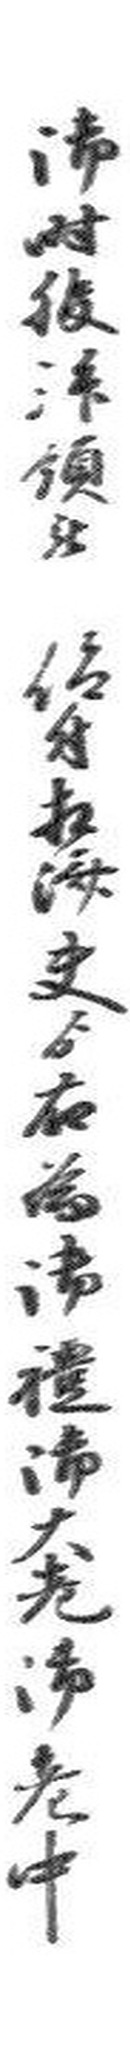御時服拝領被仰付相済夫ゟ右為御礼御大老御老中
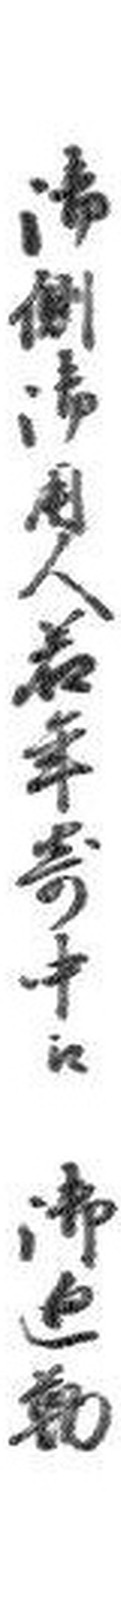御側御用人若年寄中江御廻勤
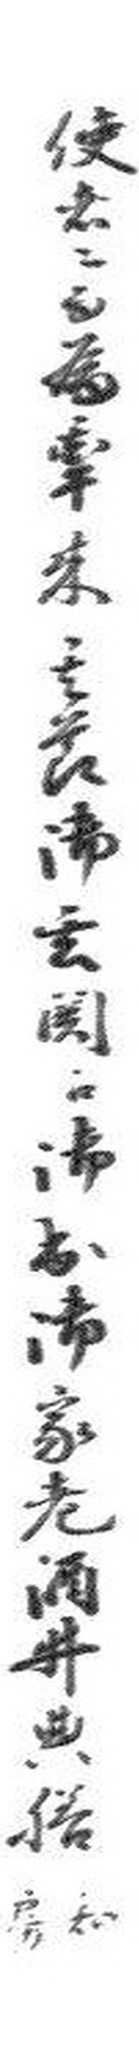使者ニ而為牽来其節御玄関江御出御家老酒井典膳知房
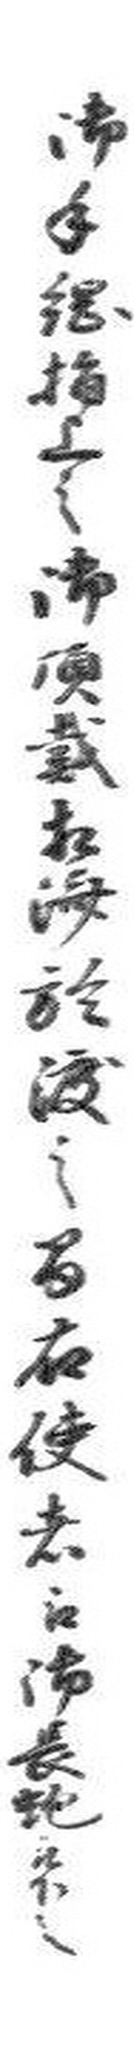御手綱指上之御頂戴相済於渡之間右使者江御長蚫被下之
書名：家譜 二十八 吉邦公 従宝永七年七月五日到正徳元年十二月
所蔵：福井県文書館 Fukui Prefectural Archives
